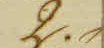2.
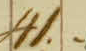41.
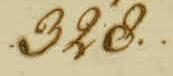328.
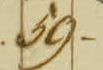59
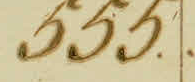555.
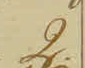2.
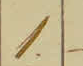1.
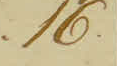16.
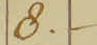8.
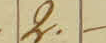2.
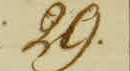29.
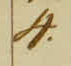4.
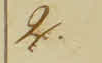2.
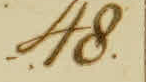48.
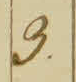3.
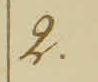2.
